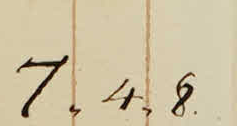7, 4, 8.
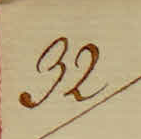32
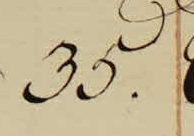35.
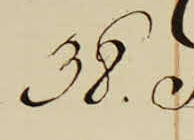38.
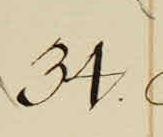34.
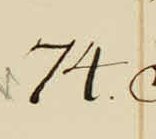74.
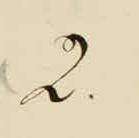2.
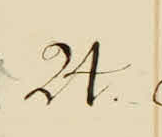24.
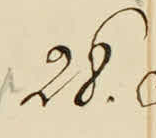28.
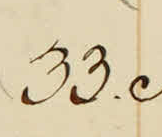33.
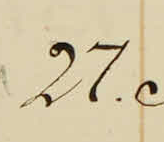27.
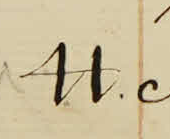41.
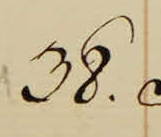38.
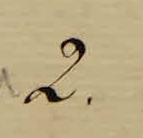2.
